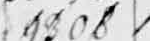9308
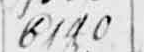6190
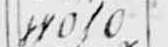11010
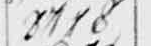3718
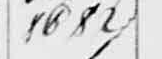1682
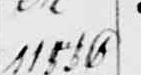11536
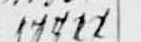17522
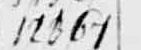12367
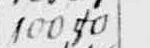10050
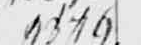9379
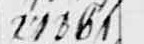22361
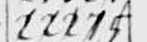22275
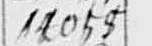14055
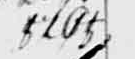5265
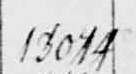13074
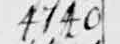4740
